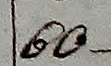60
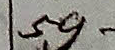59
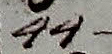44
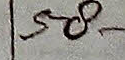58
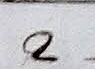2
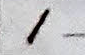1
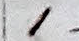1
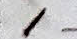1
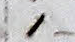1
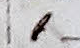1
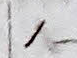1
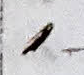1
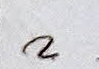2
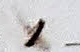1
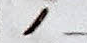1
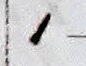1
